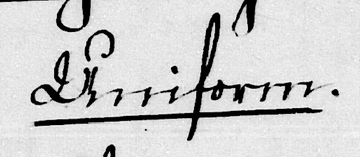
Uniform.
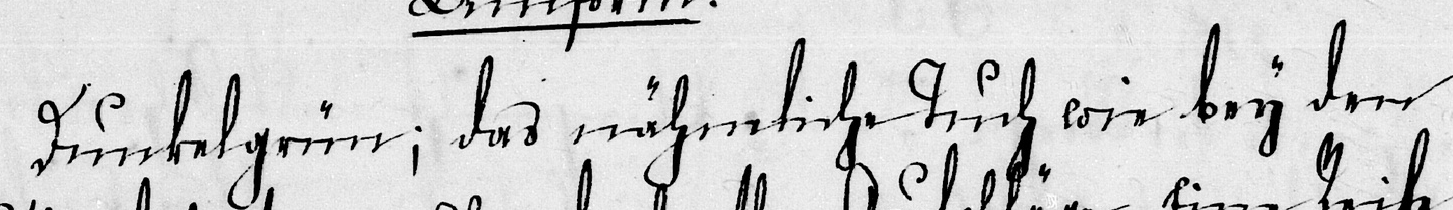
Dunkelgrün; das nähmliche Tuch wie bey den
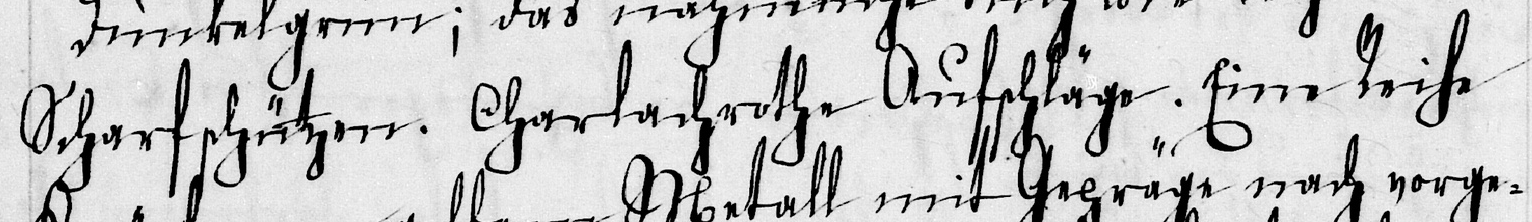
Scharfschützen. Charlachrothe Aufschläge. Eine Reihe
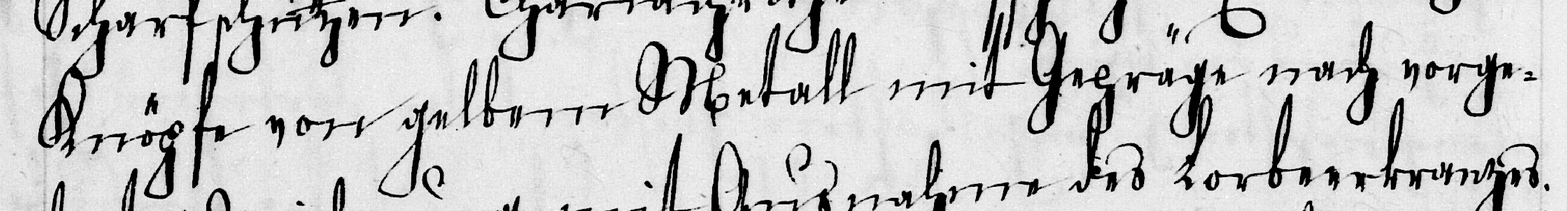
Knöpfe von gelbem Metall mit Gepräge nach vorge¬
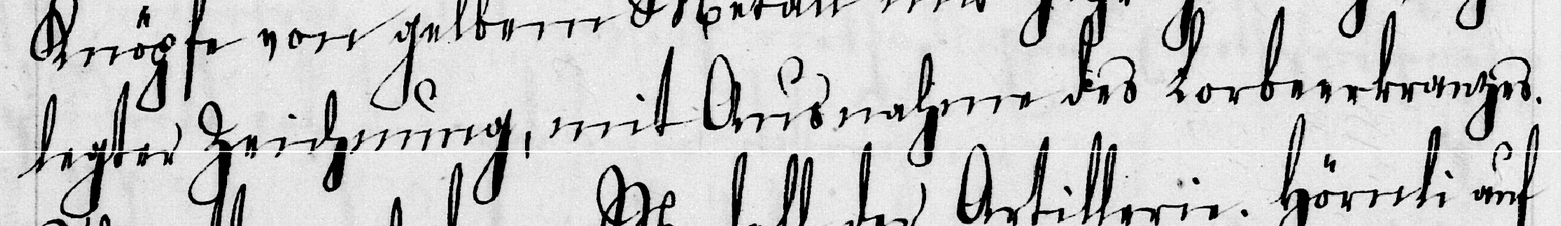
legter Zeichnung, mit Ausnahme des Lorbeerkranzes.
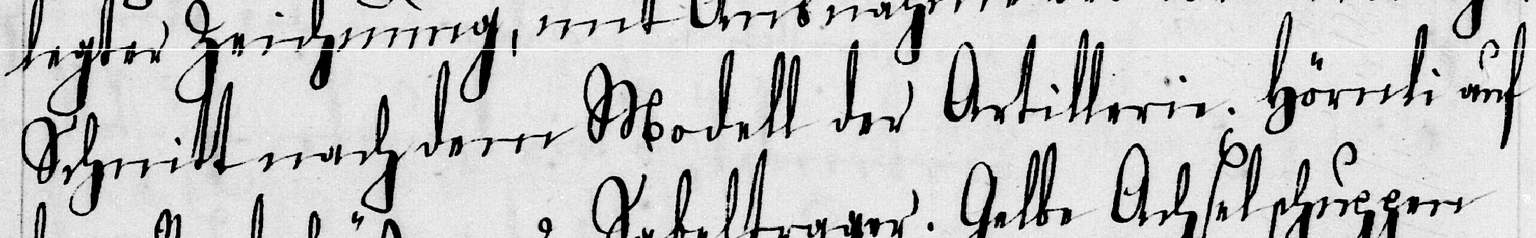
Schnitt nach dem Modell der Artillerie. Hörnli auf
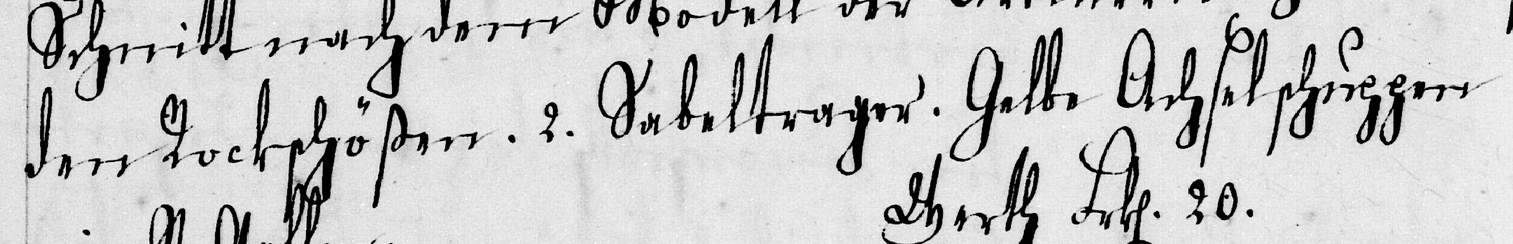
den Rockschößen. 2. Sabeltrager. Gelbe Achselschuppen
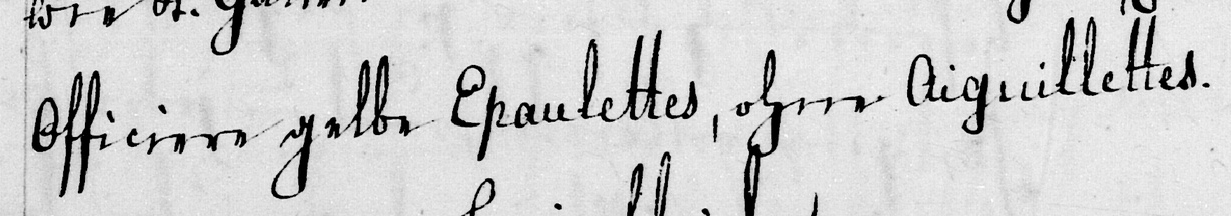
Officiere gelbe Epaulettes, ohne Aiguillettes.
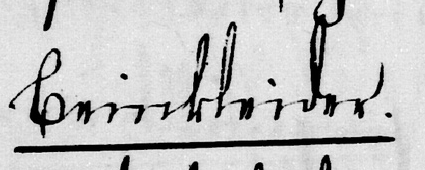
Beinkleider.
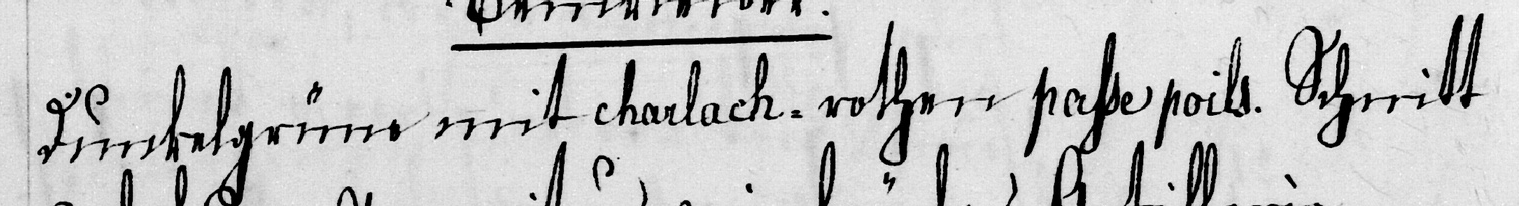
Dunkelgrüne mit charlach-rothen passer poils. Schnitt
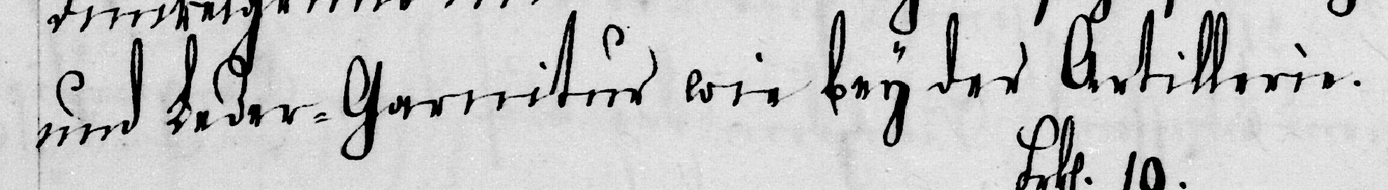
und Leder-Garnitur wie bey der Artillerie.
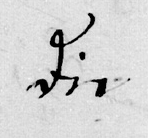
wie
